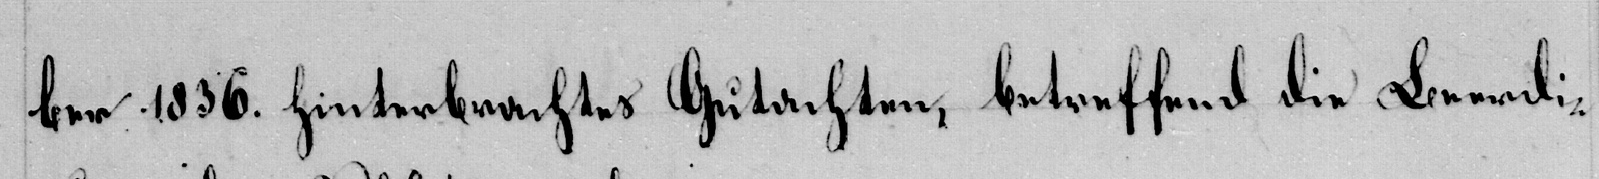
ber 1836. hinterbrachtes Gutachten, betreffend die Beerdi¬
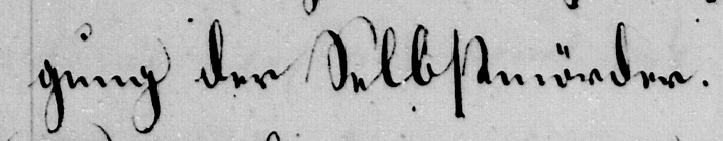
gung der Selbstmörder.
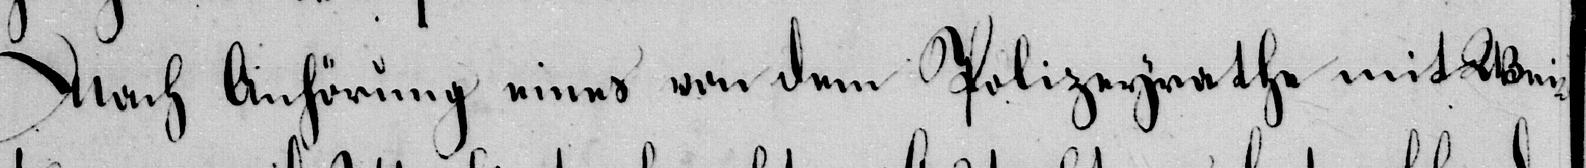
Nach Anhörung eines von dem Polizeyrathe mit Wei¬
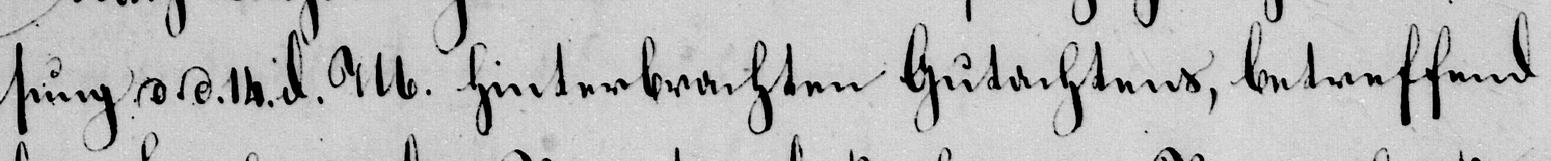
sung d. d. 14. d. M. hinterbrachten Gutachtens, betreffend
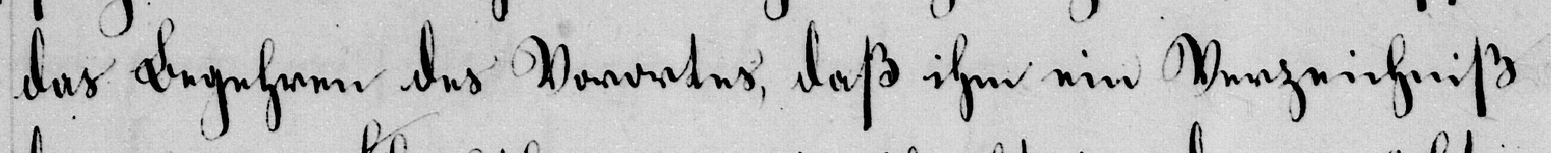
das Begehren des Vorortes, daß ihm ein Verzeichniß
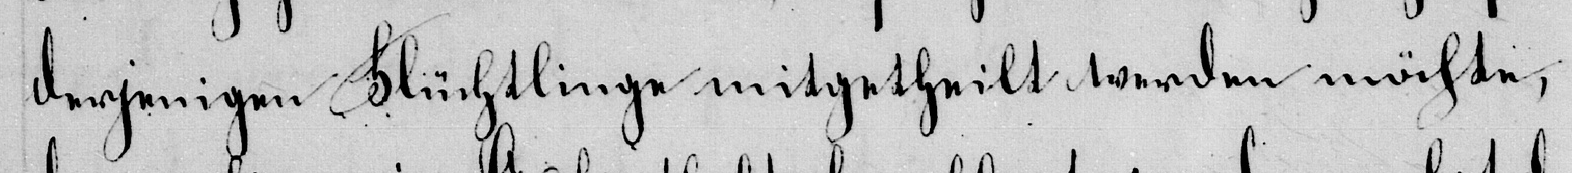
derjenigen Flüchtlinge mitgetheilt werden möchte,
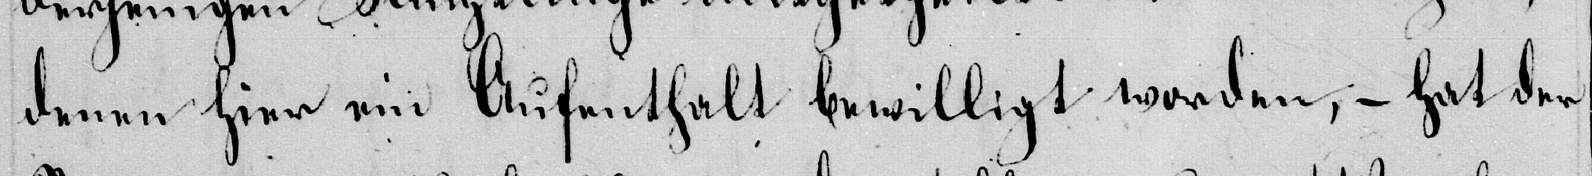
denen hier ein Aufenthalt bewilligt worden, – hat der
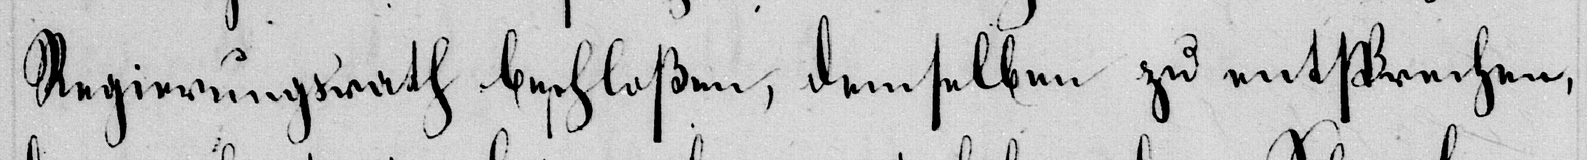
Regierungsrath beschloßen, demselben zu entsprechen,
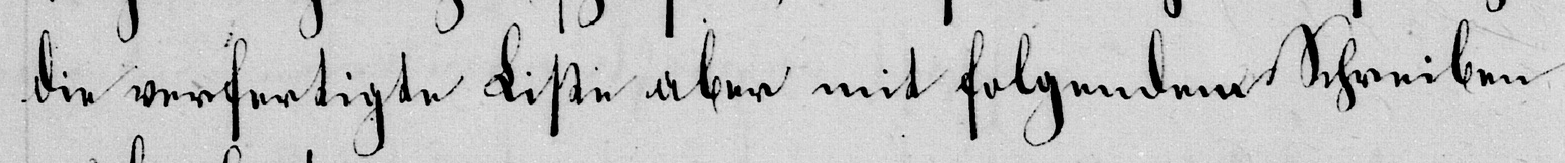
die verfertigte Liste aber mit folgendem Schreiben
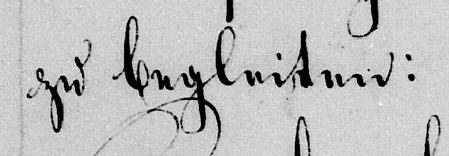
zu begleiten:
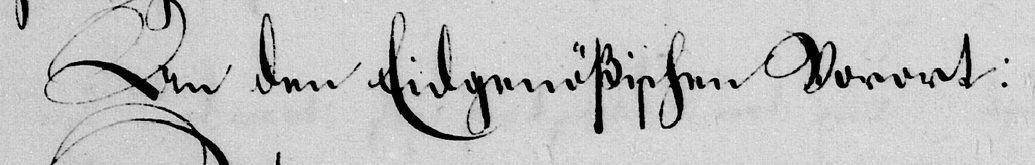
An den Eidgenößischen Vorort:
